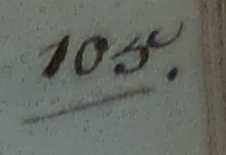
105.
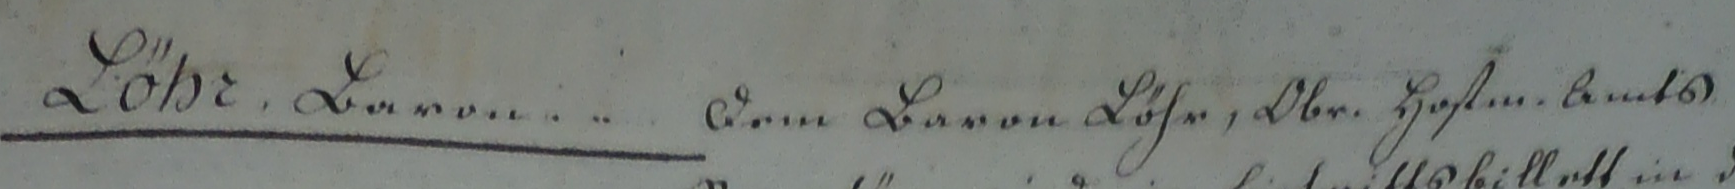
Löhr, Baron. .. Dem Baron Löhr, Obr. Hof. u. Amts
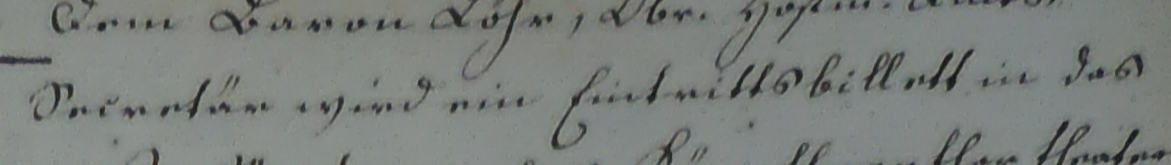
Secretär wird ein Eintrittsbillett in das
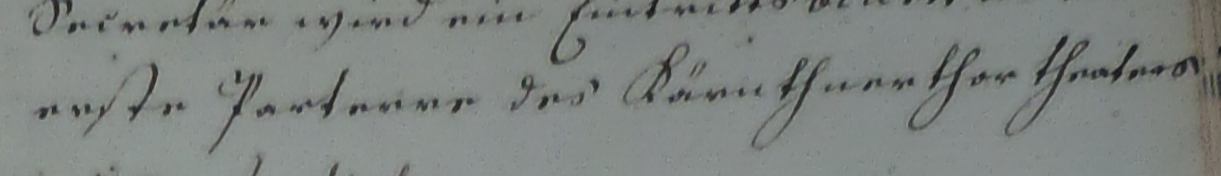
erste Parterre des Kärnthnerthor theaters
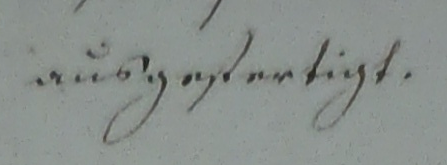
ausgefertigt.
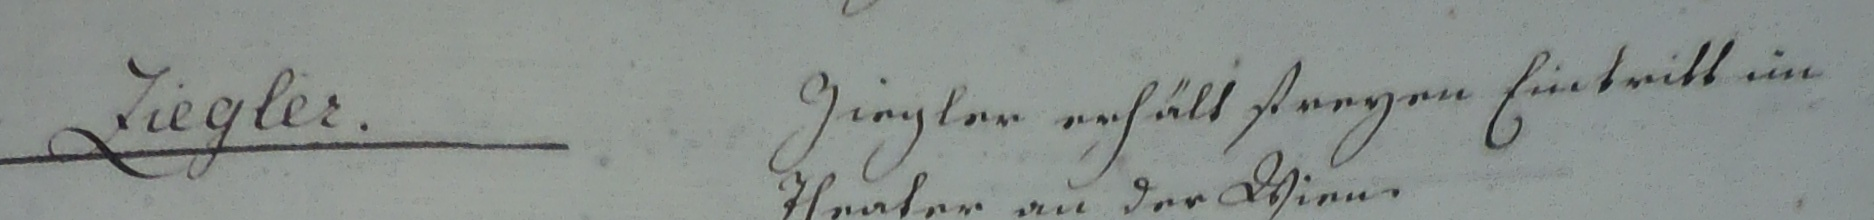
Ziegler. Ziegler erhält freyen Eintritt im
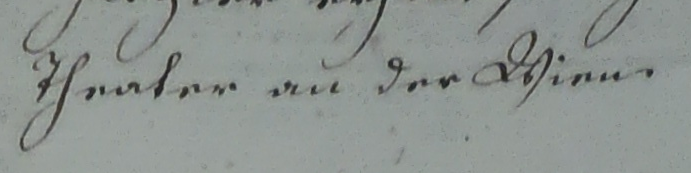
Theater an der Wien.
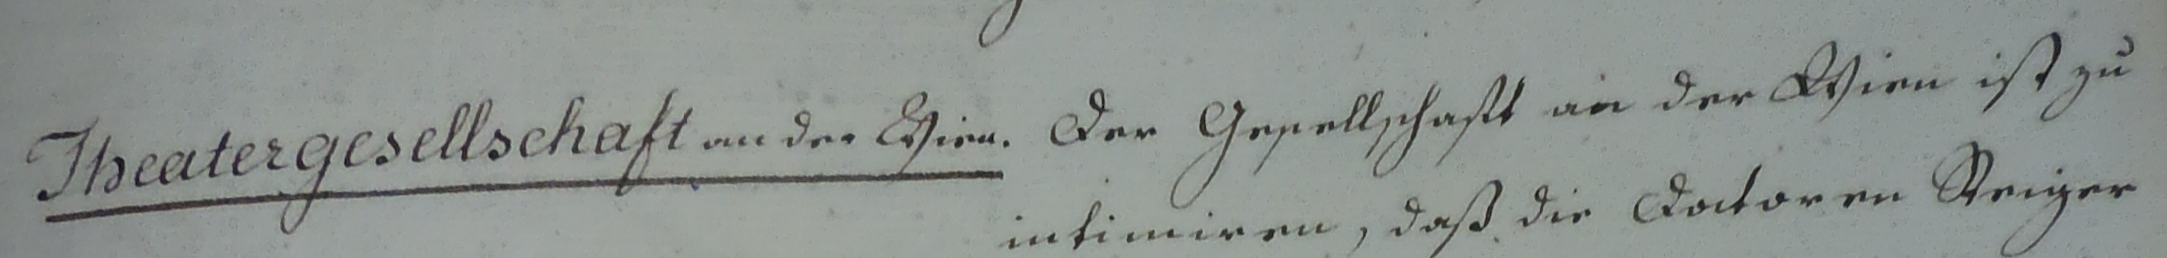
Theatergesellschaft an der Wien. Der Gesellschaft an der Wien ist zu
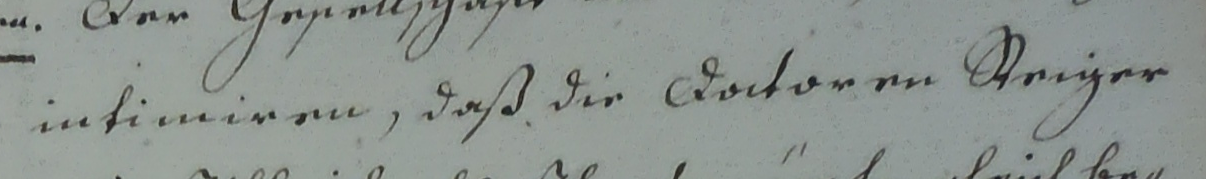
intimiren, daß die Doctoren Steiger
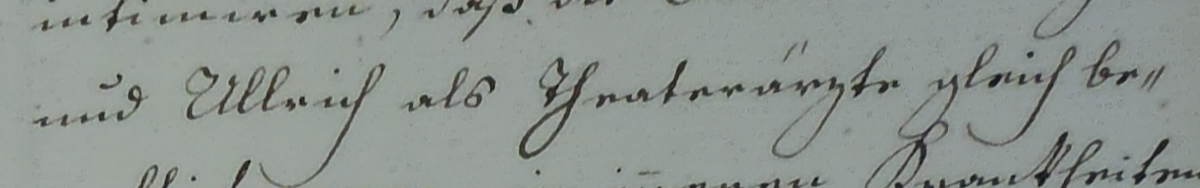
und Ullrich als Theaterärzte gleich be¬
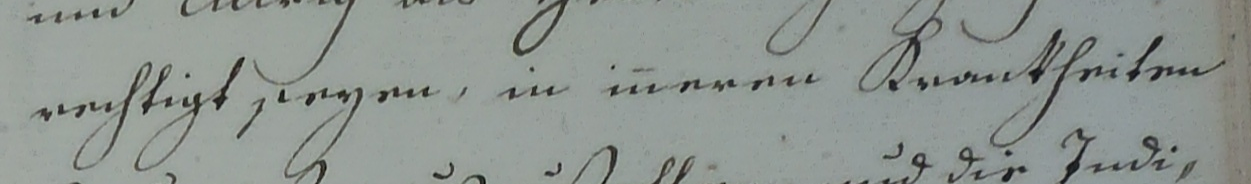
rechtigt seyen, in in̅eren Krankheiten
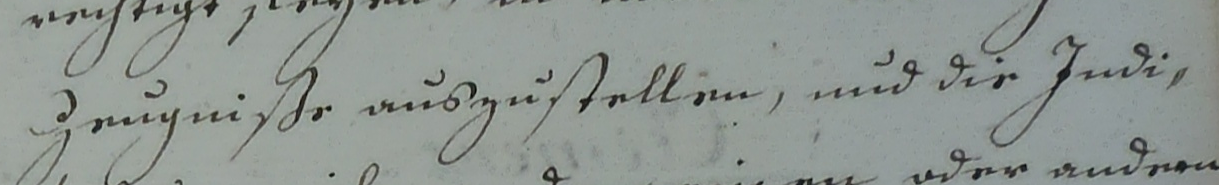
Zeugniße auszustellen, und die Indi¬
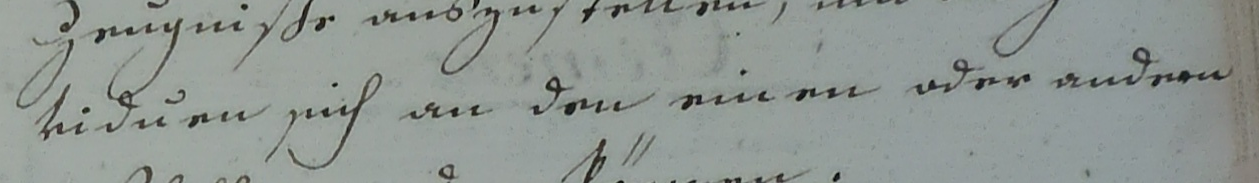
viduen sich an den einen oder andern
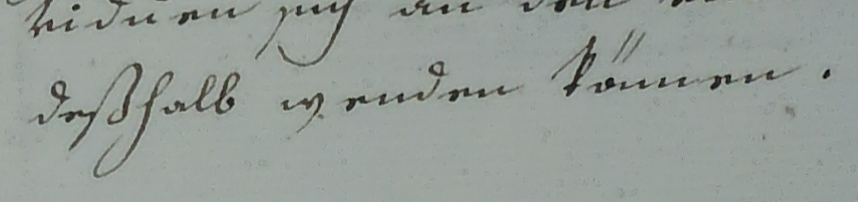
deßhalb wenden können.
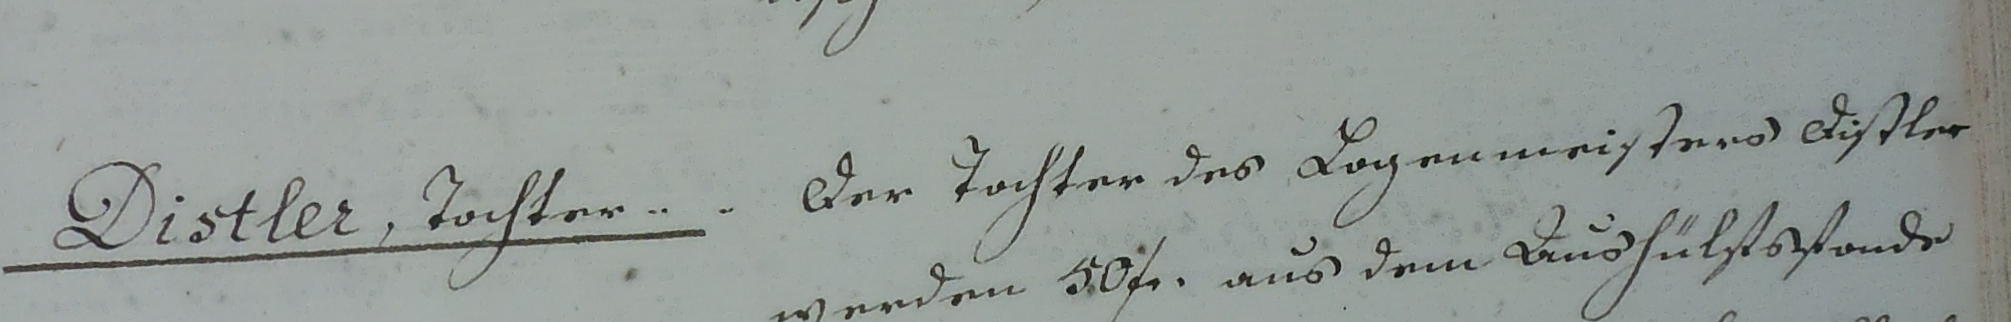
Distler, Tochter .. .. Der Tochter des Logenmeistens Distler
